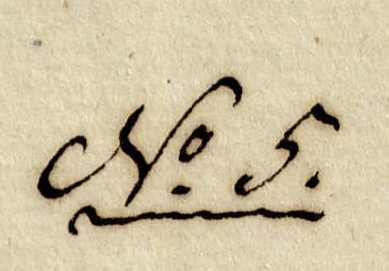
No 5.
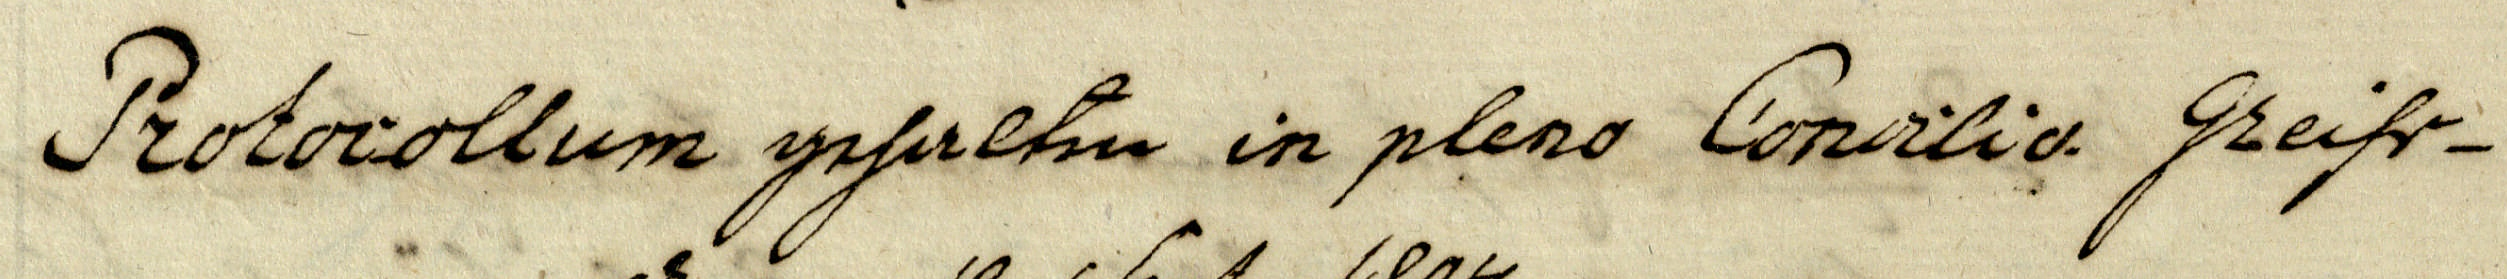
Protocollum gehalten in pleno Concilio Greifs¬
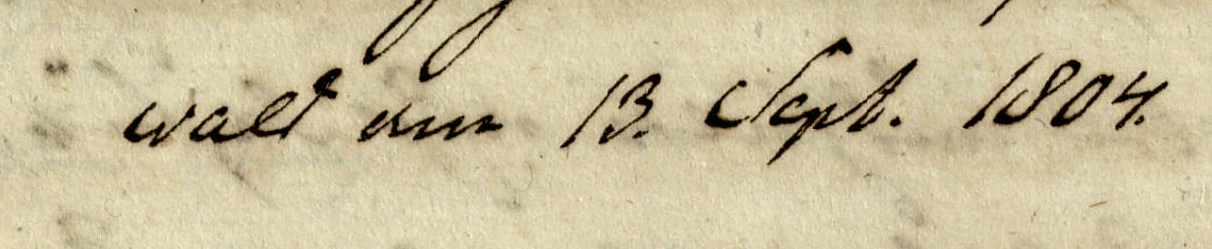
wald am 13. Sept. 1804.
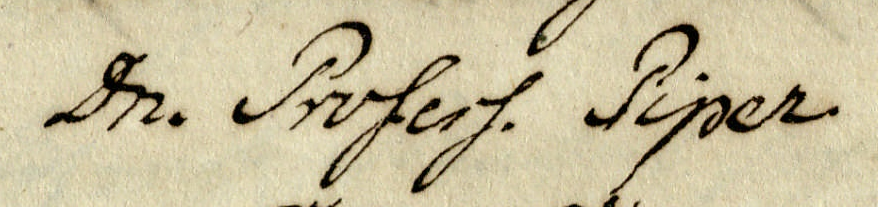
Dn. Profess. Piper.
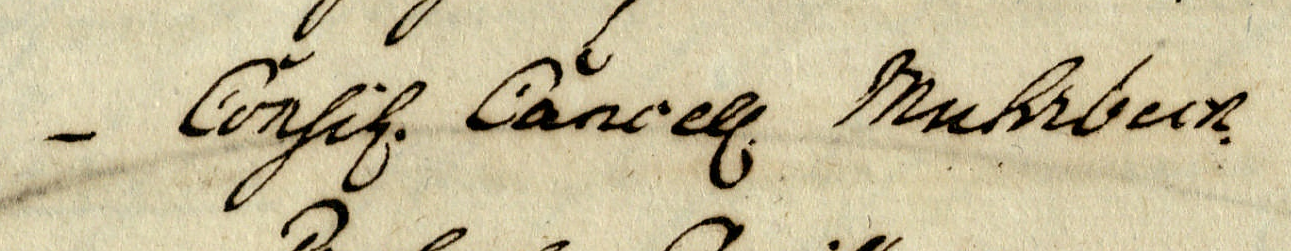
Consis. Cancel. Muhrbeck.
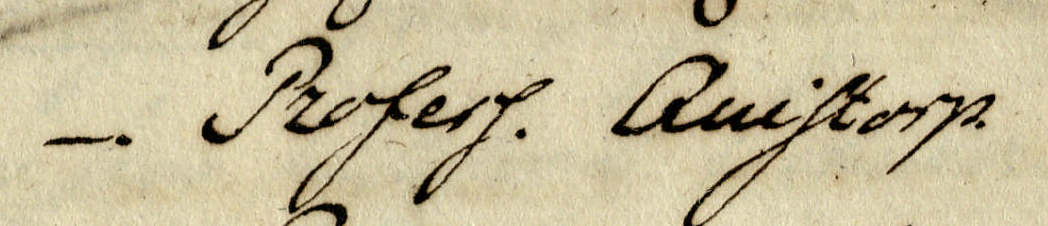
Profess. Quistorp.
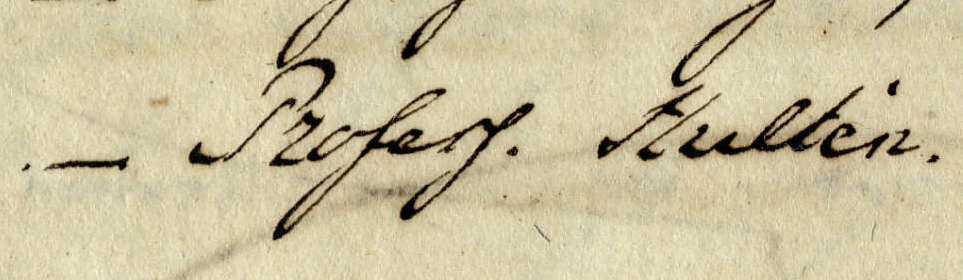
Profess. Hultén.
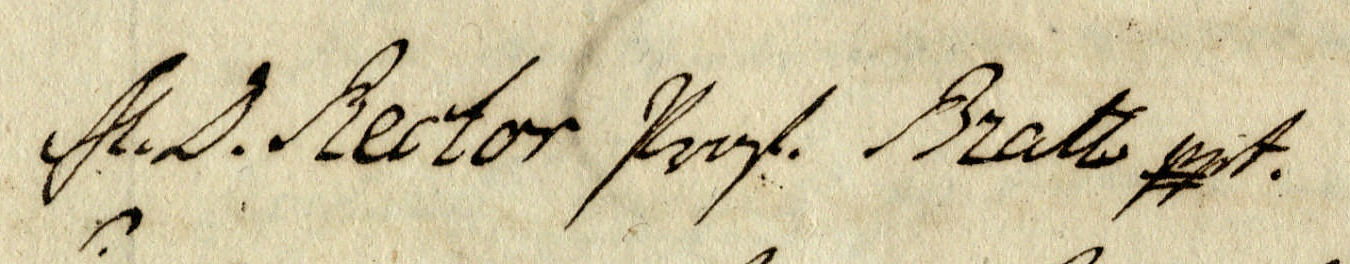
M. D. Rector Prof. Bratt ppt.
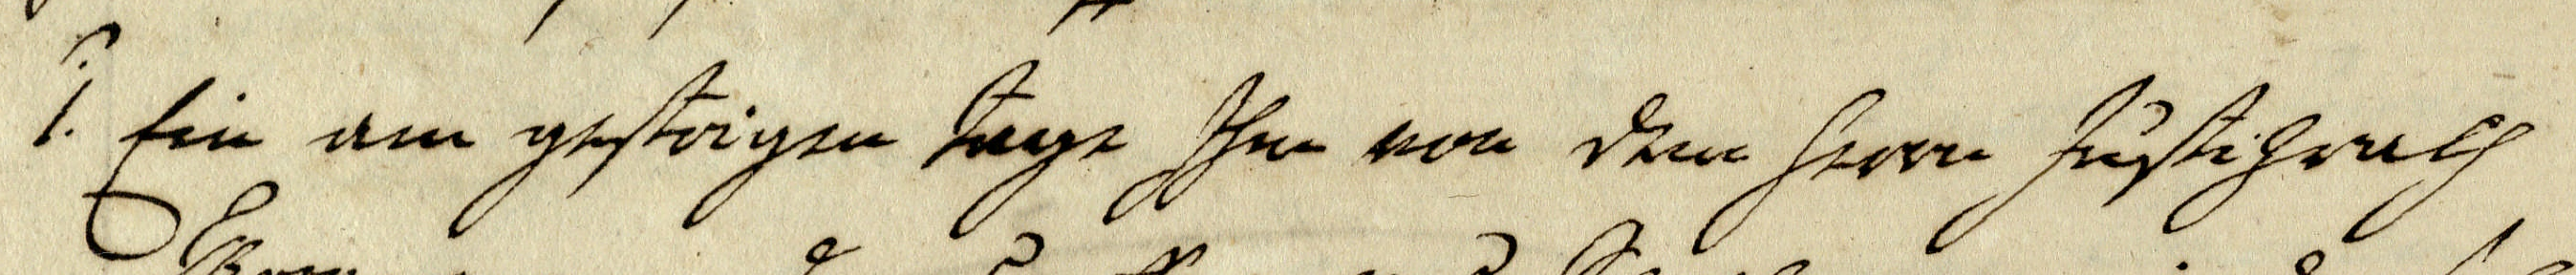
1. Ein am gestrigen Tage Ihm von dem Herrn Justizrath
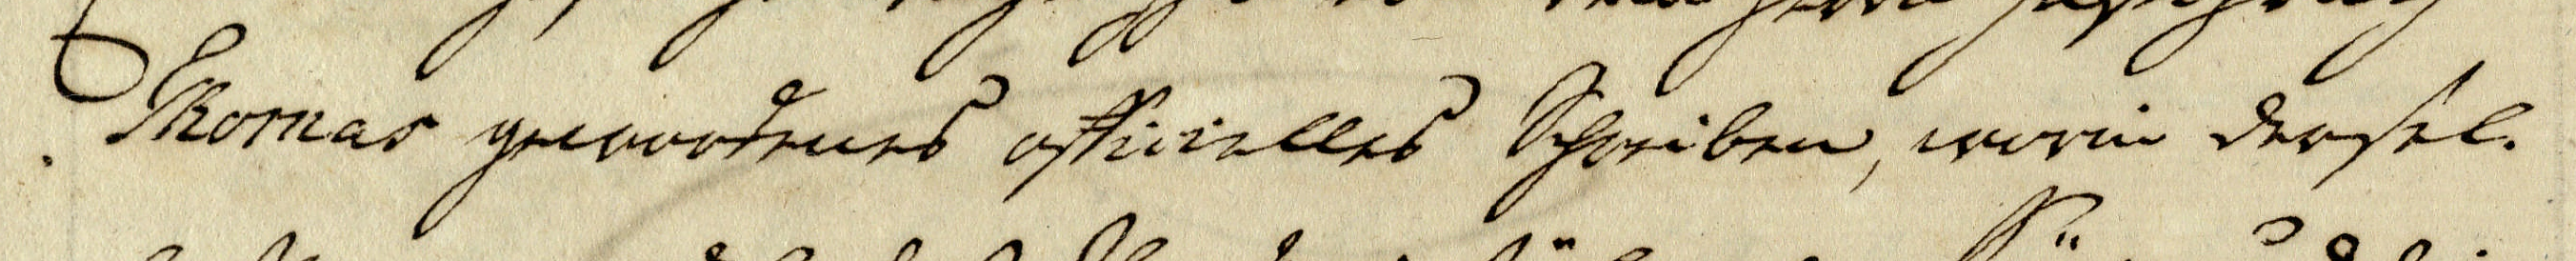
Thomas gewordenes officielles Schreiben, worin dersel¬
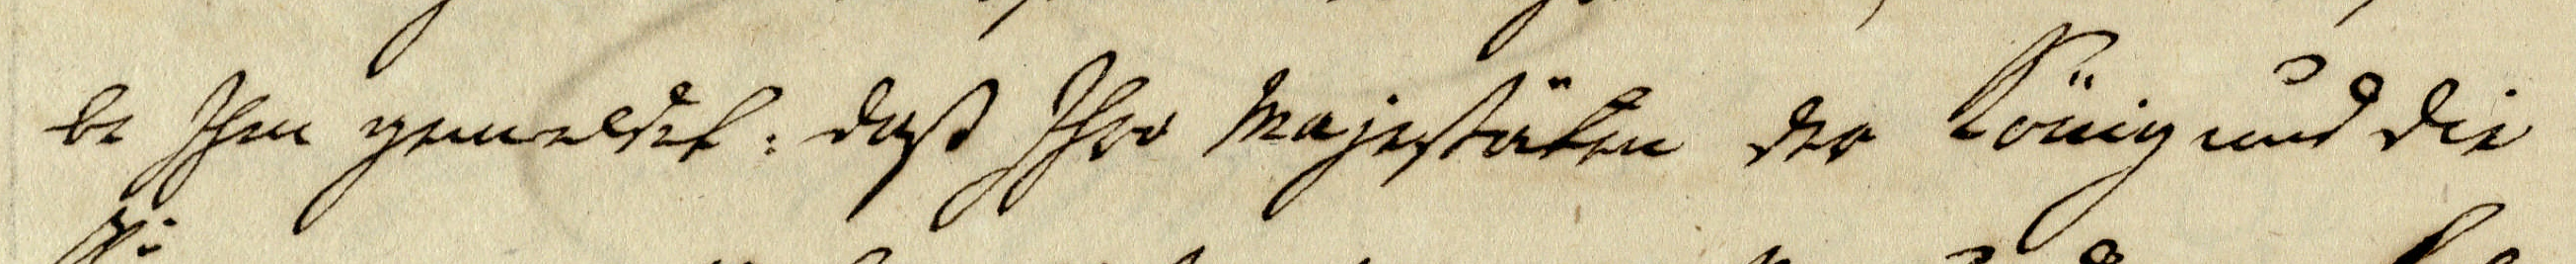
be Ihm gemeldet: daß Ihro Majestäten der König und die
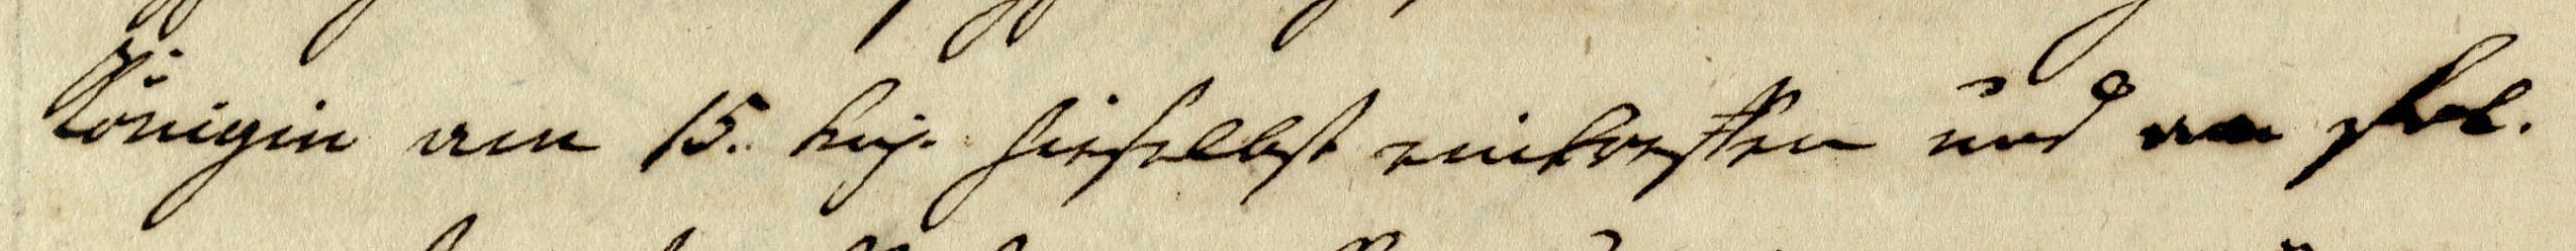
Königin am 15. huj. hieselbst eintreffen und am fol¬
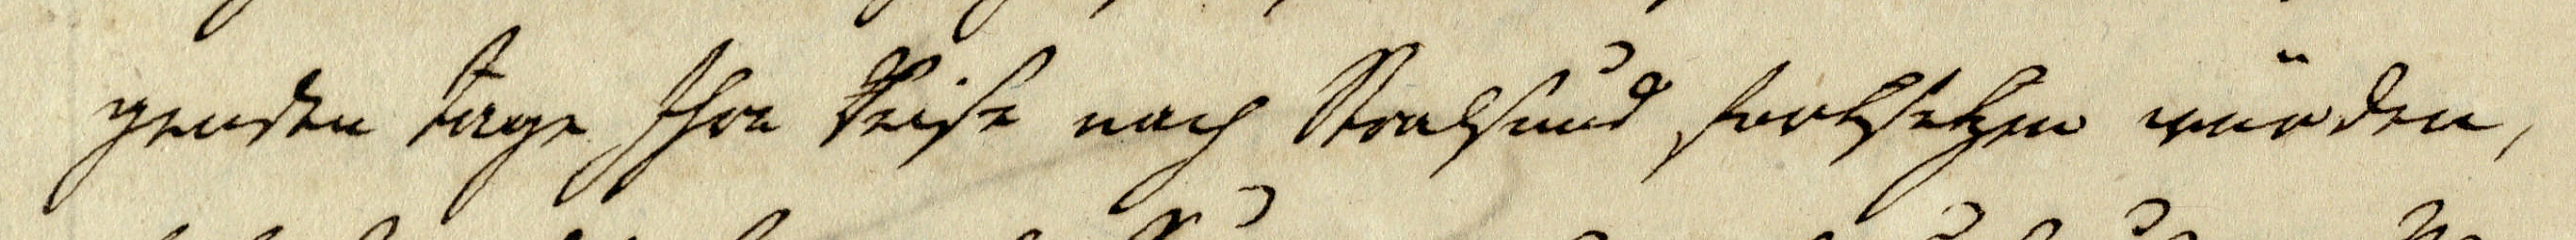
genden Tage Ihre Reise nach Stralsund fortsetzen würden,
